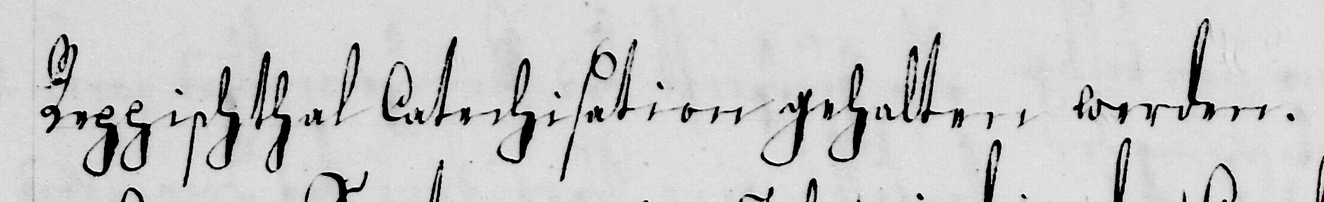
Reppischtal Catechisation gehalten werden.
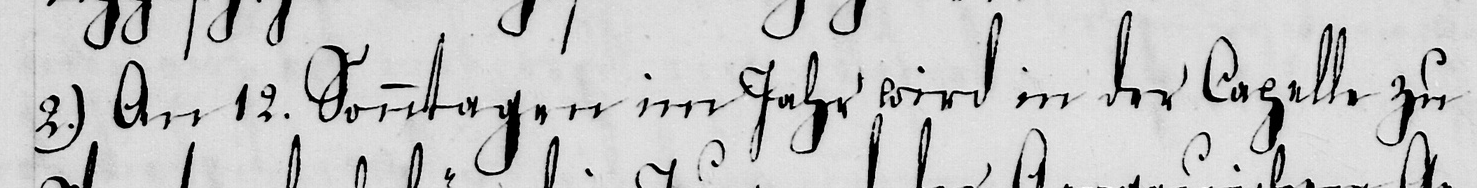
2.) An 12. Sonntagen im Jahr wird in der Capelle zu
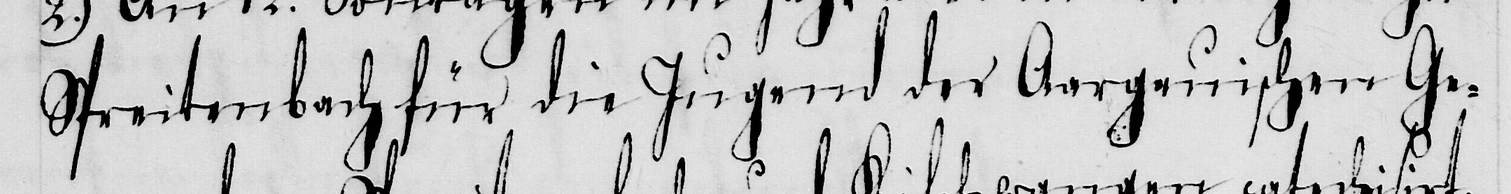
Spreitenbach für die Jugend der Aargauischen Ge¬
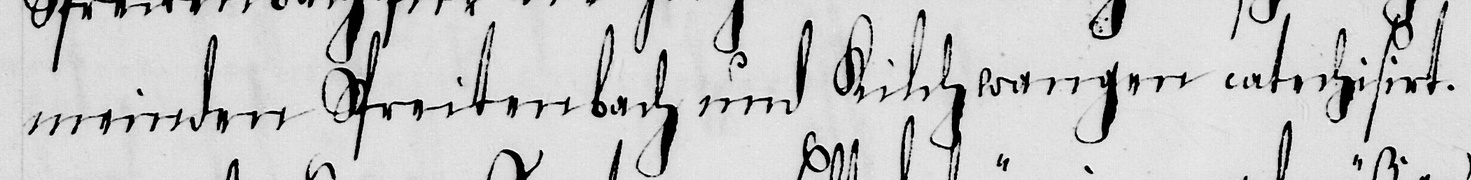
meinden Spreitenbach und Kilchwangen catechisirt.
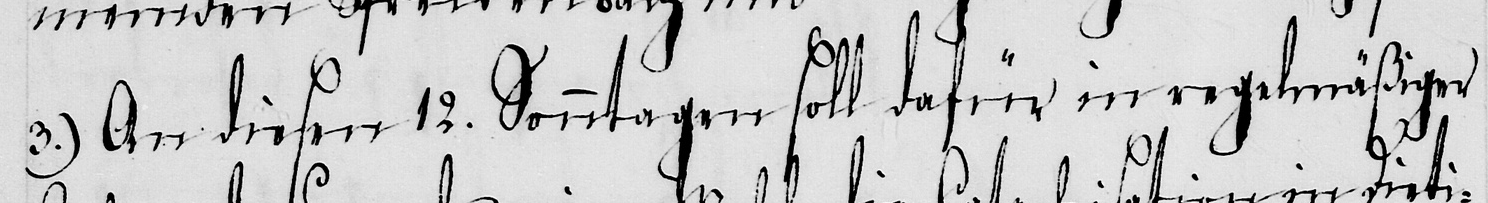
3.) An diesen 12. Sonntagen soll dafür in regelmäßiger
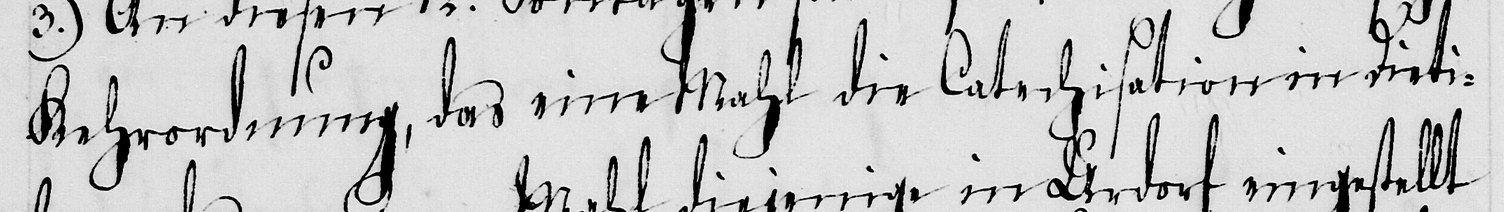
Kehrordnung, das eine Mahl die Catechisation in Dieti¬
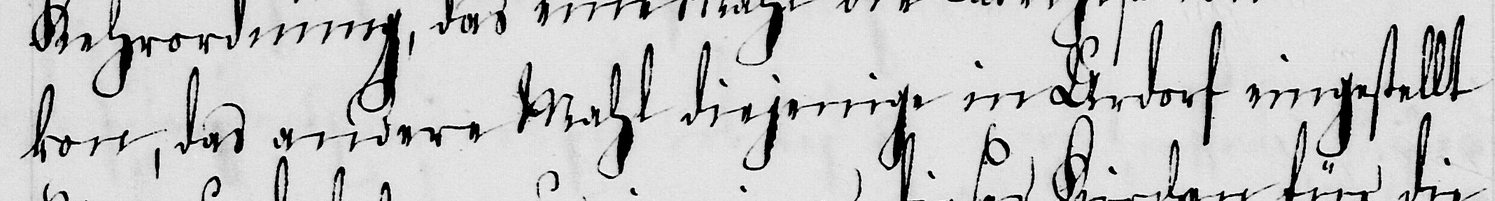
kon, das andere Mahl diejenige in Urdorf eingestellt
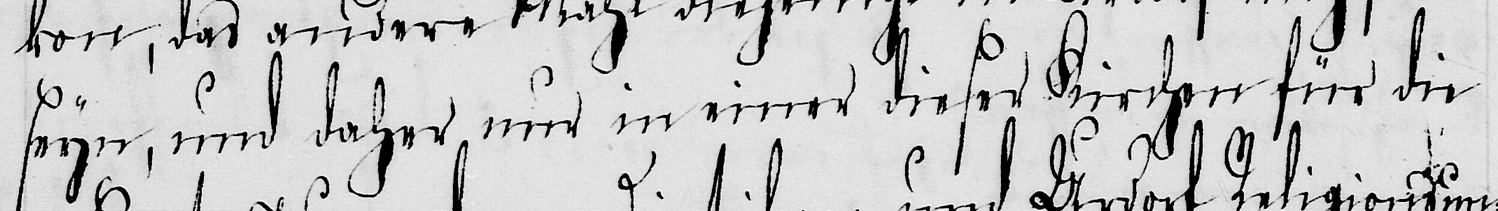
seyn, und daher nur in einer dieser Kirchen für die
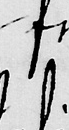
en.
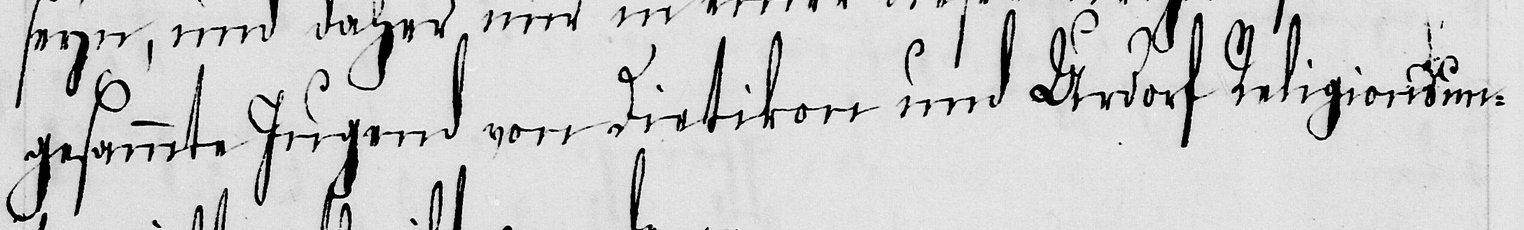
gesammte Jugend von Dietikon und Urdorf Religionsun¬
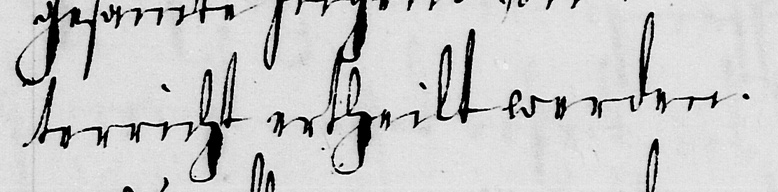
terricht ertheilt werden.
